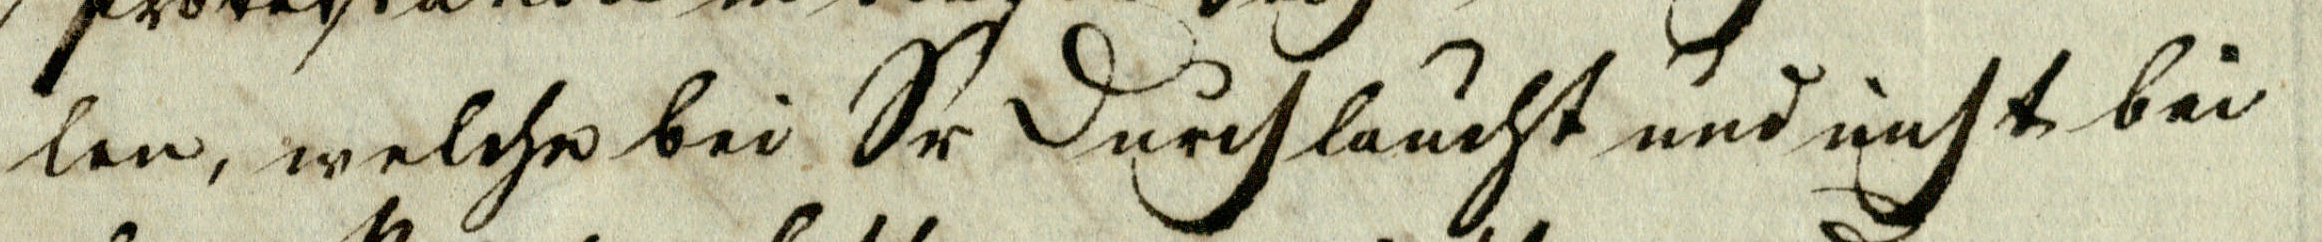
len, welche bei Sr Durchlaucht und nicht bei
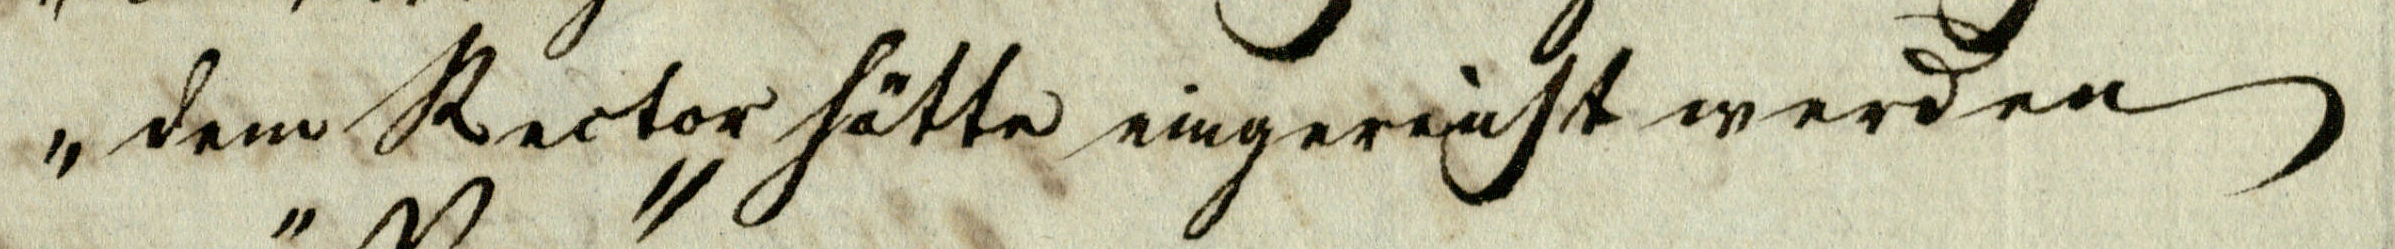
dem Rector hätte eingereicht werden
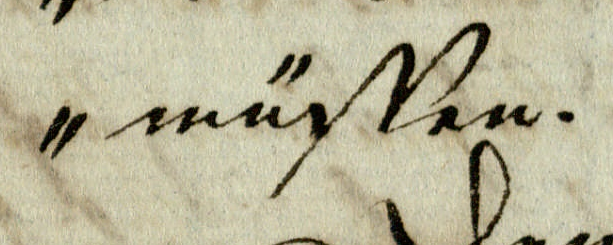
müssen."
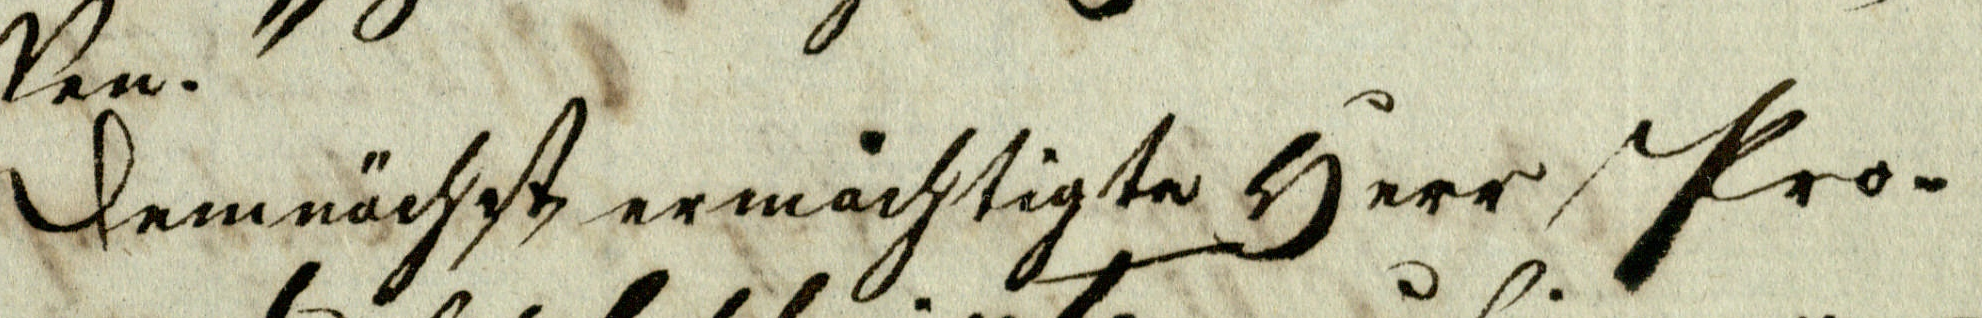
Demnächst ermächtigte Herr Pro¬
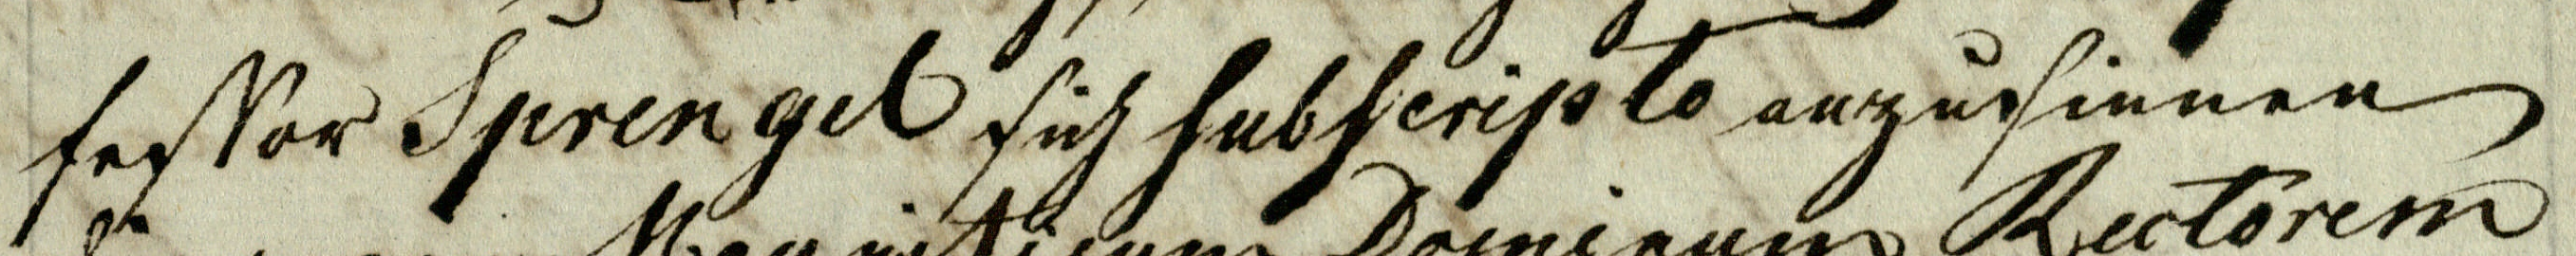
fessor Sprengel sich subscripto anzusinnen
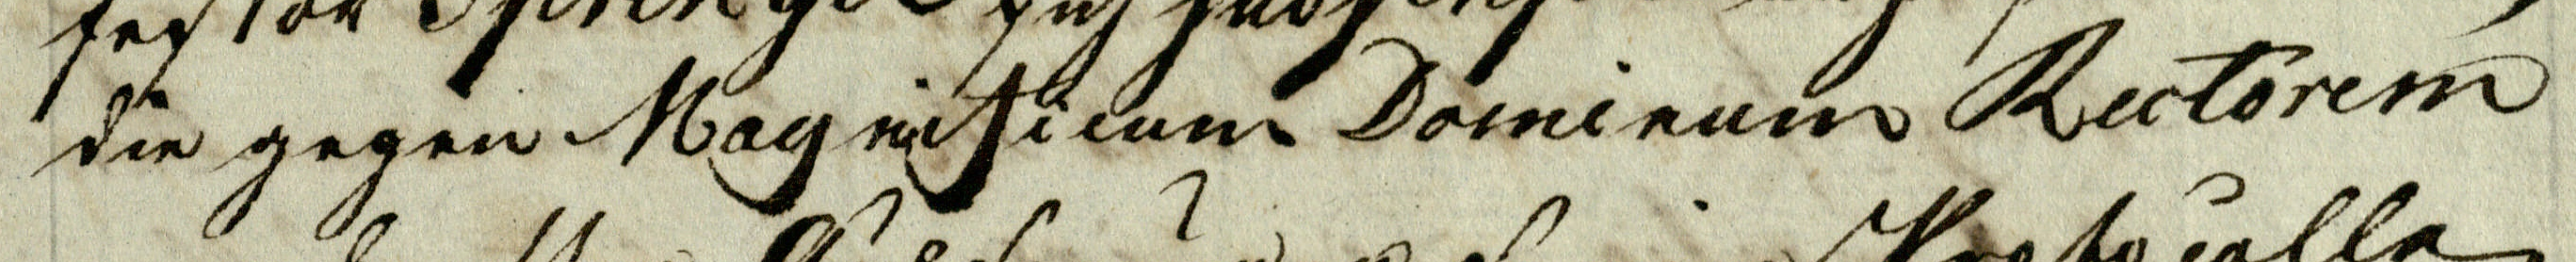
die gegen Magnificum Dominum Rectorem
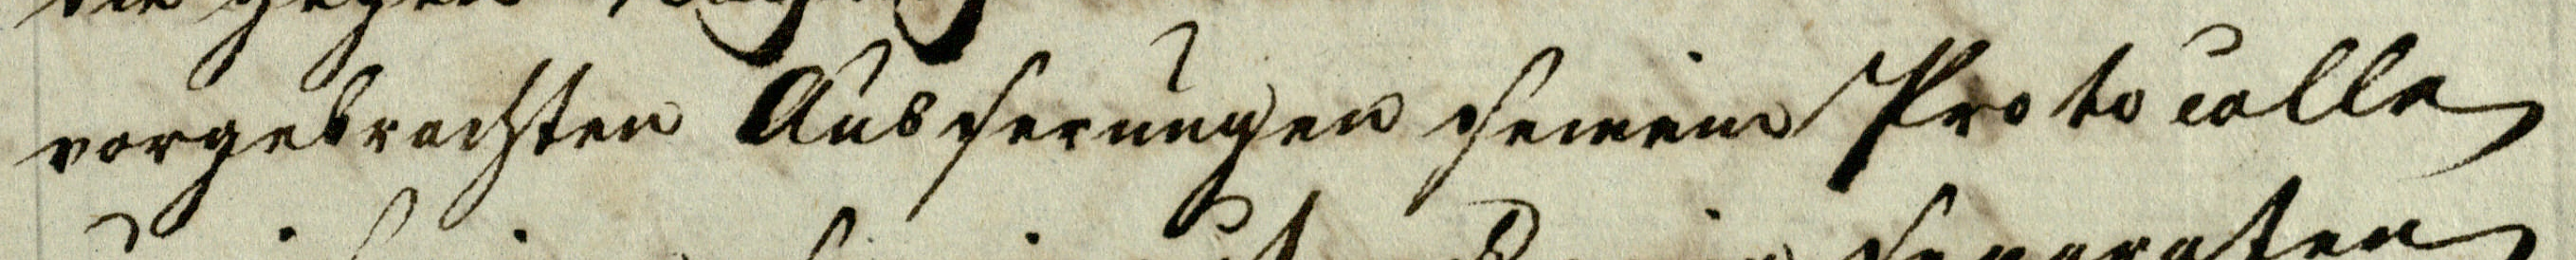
vorgebrachten Äusserungen seinem Protocolla
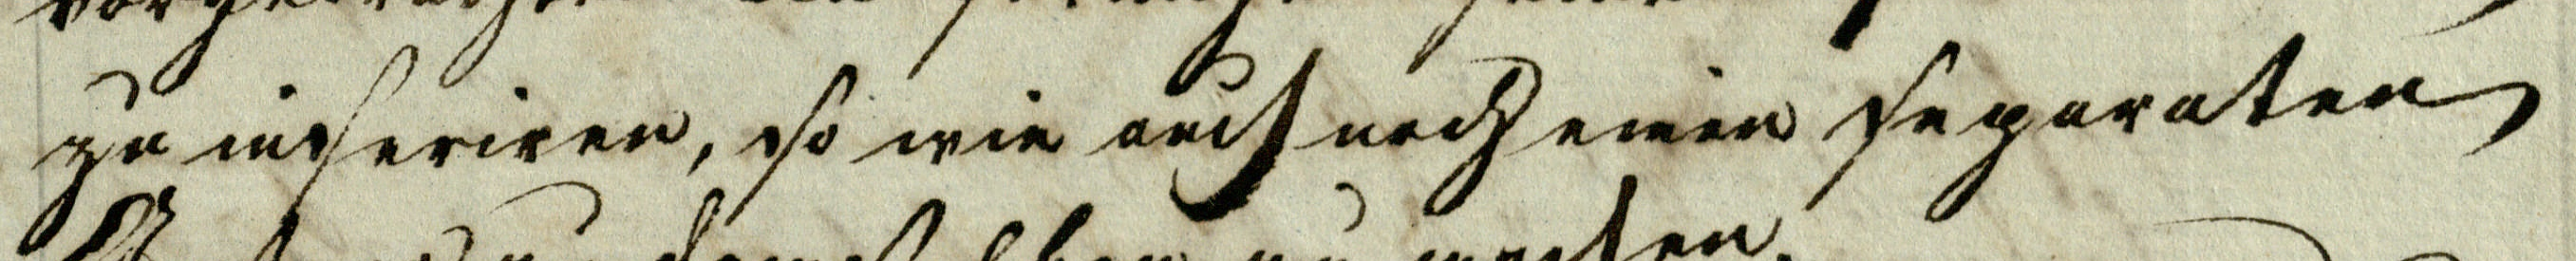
zu inseriren, so wie auch nach einem separaten
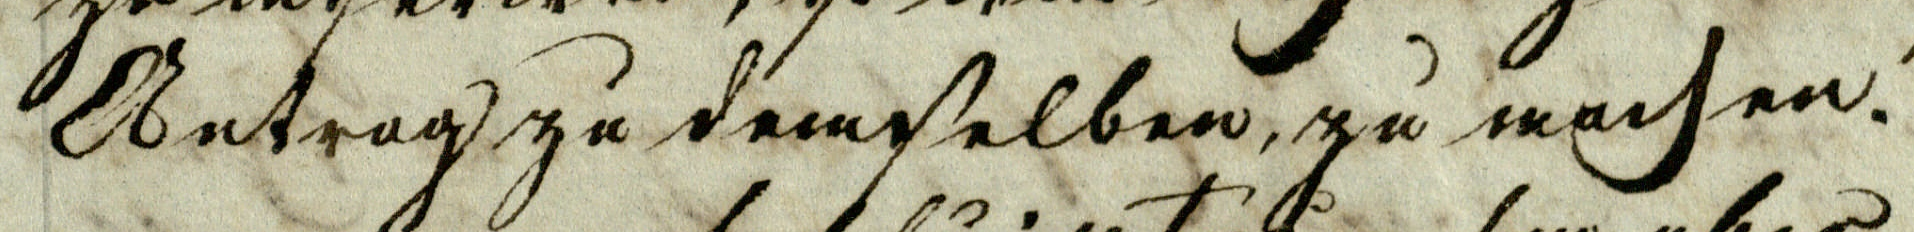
Antrag zu demselben, zu machen.
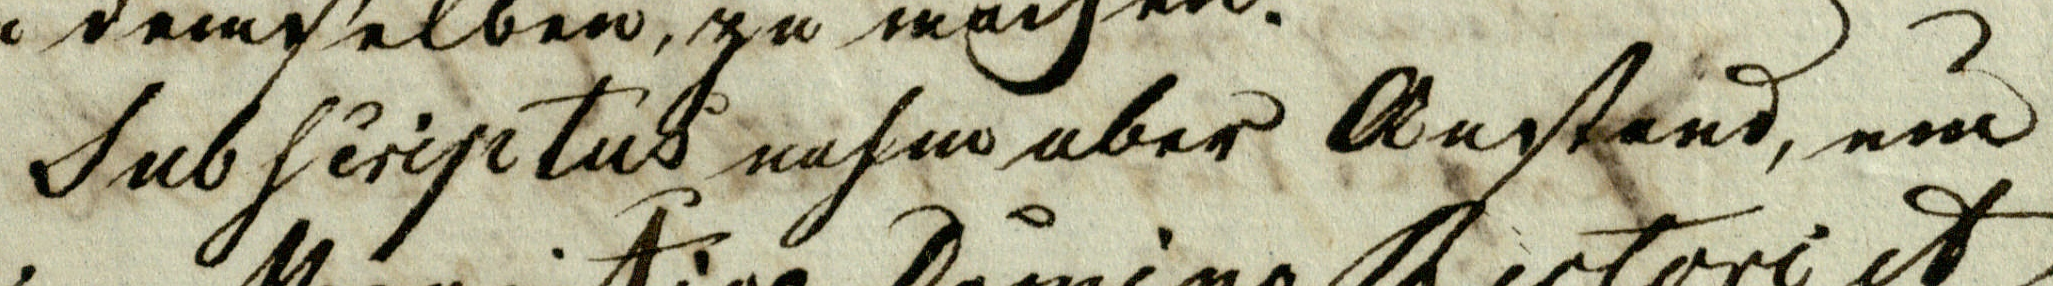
Subscriptus nahm aber Anstand, um
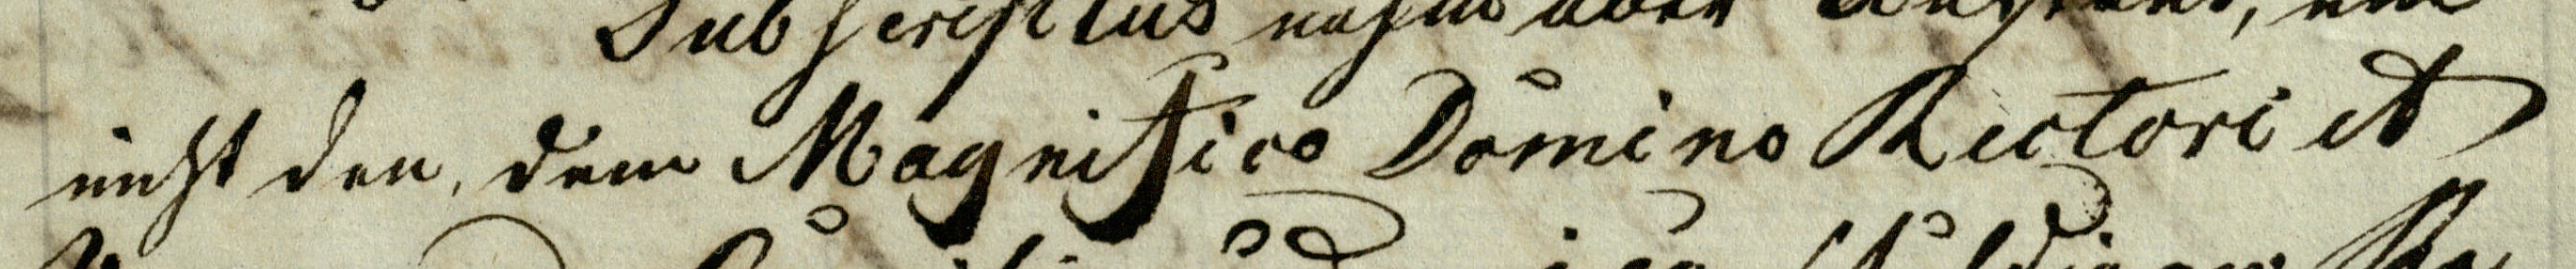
nicht den, dem Magnifico Domino Rectori et
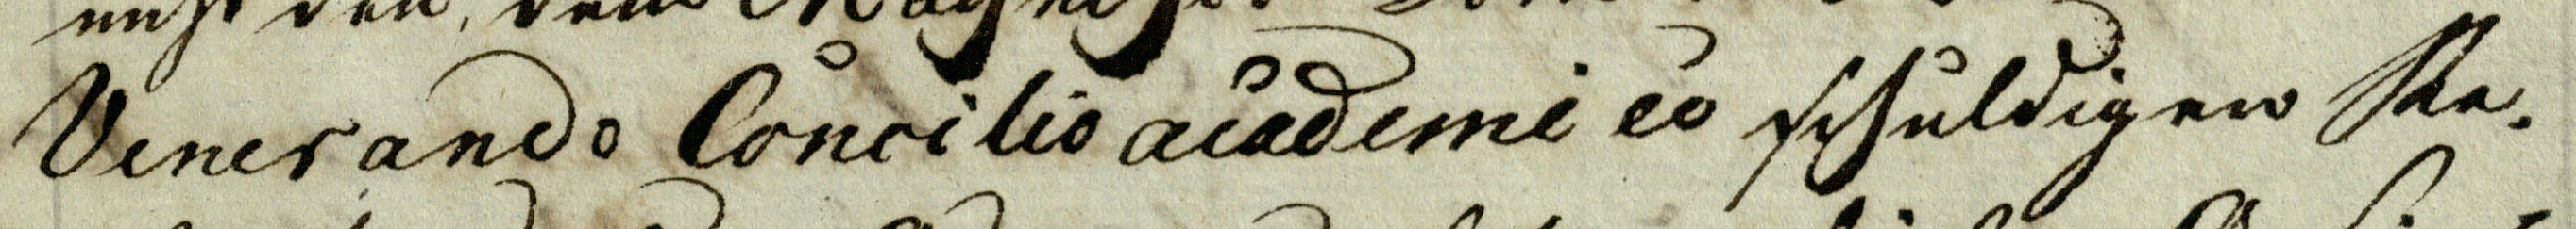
Venerando Concilio academico schuldigen Re¬
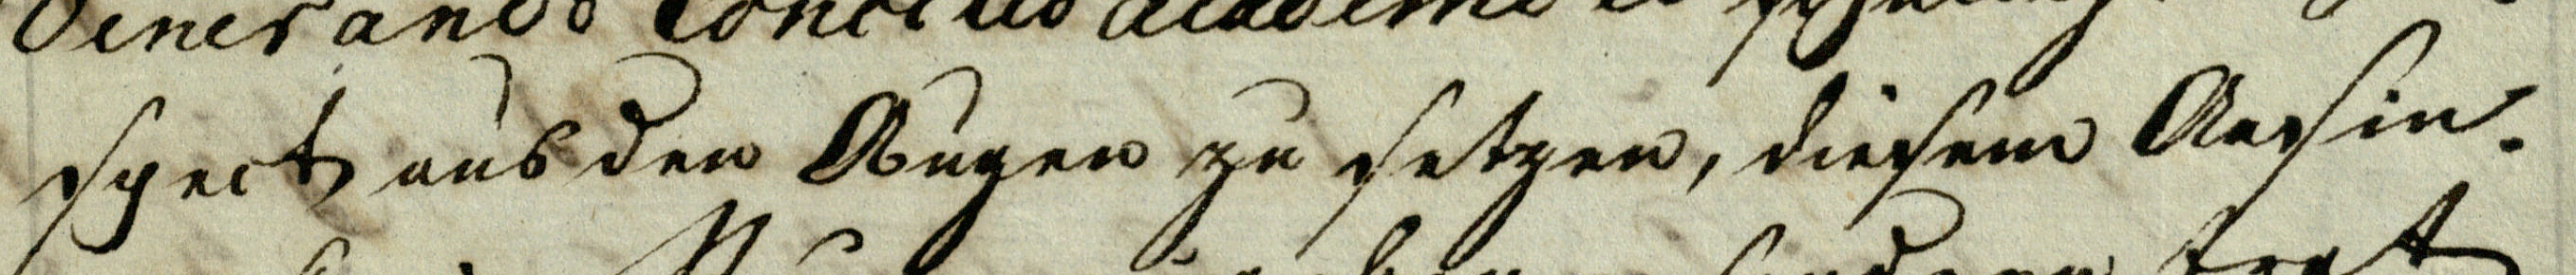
spect aus den Augen zu setzen, diesem Ansin¬
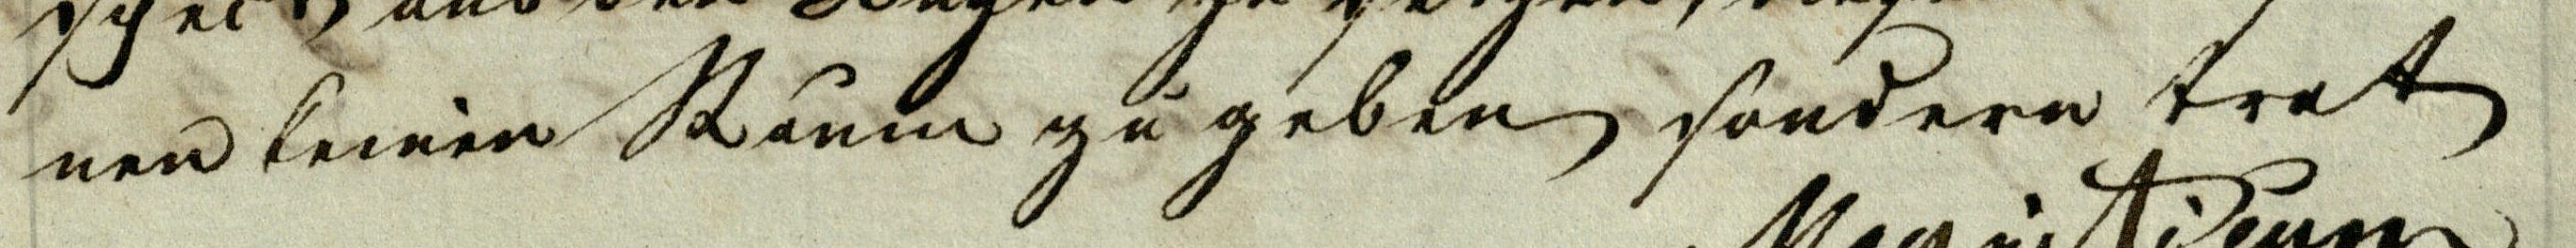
nen keinen Raum zu geben sondern trat
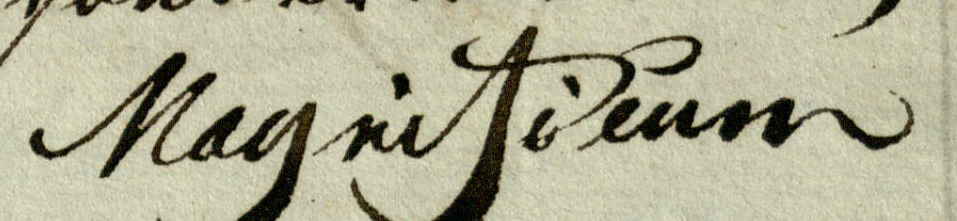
Magnificum
